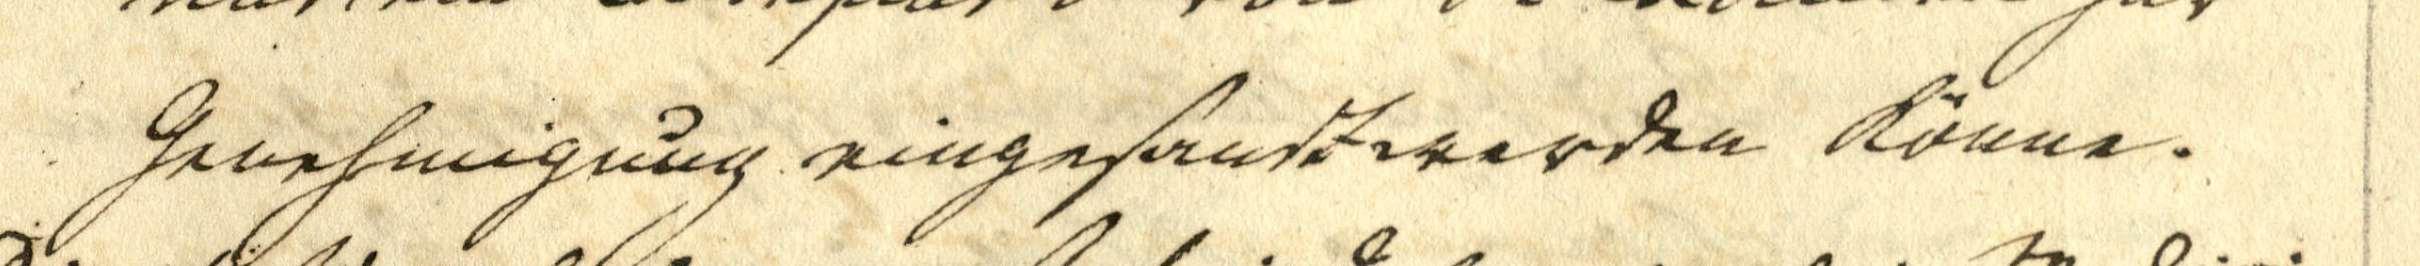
Genehmigung eingesandt werden könne.
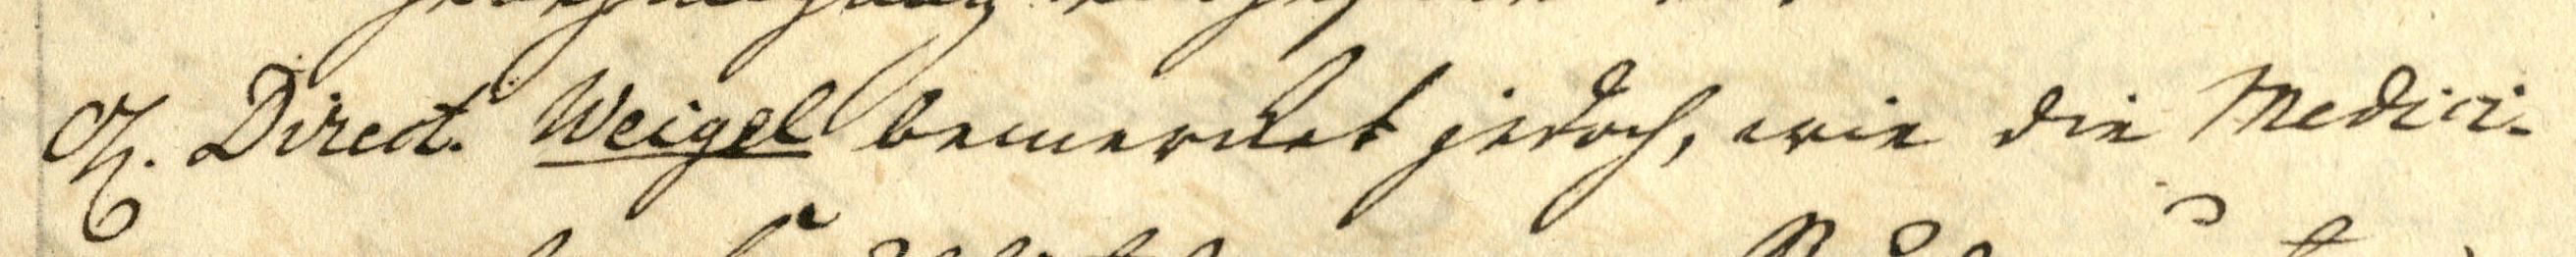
dh. Direct Weigel bemercket jedoch, wie die Medici¬
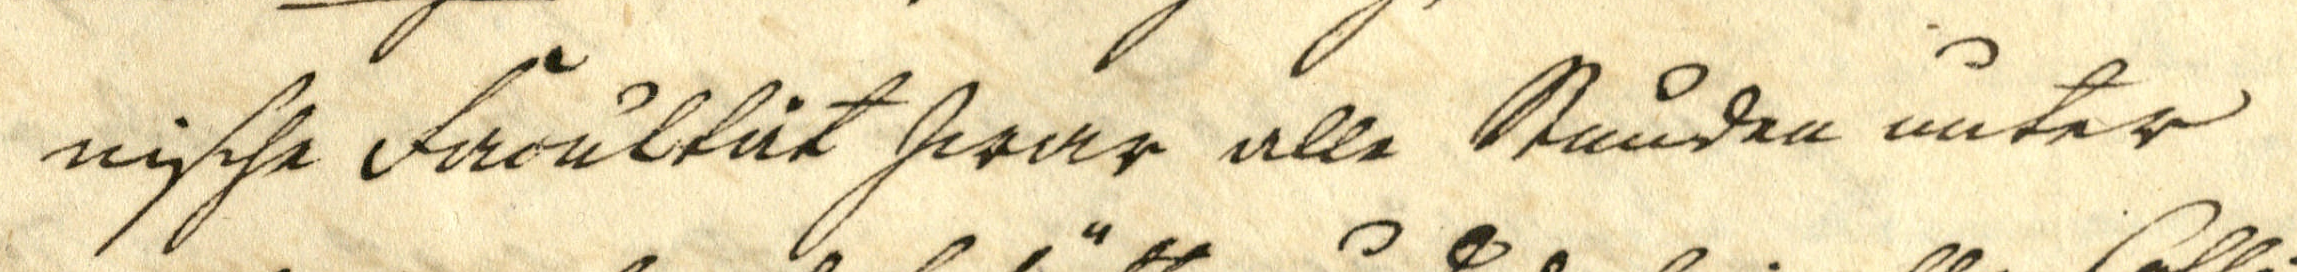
nische Facultät zwar alle Stunden unter
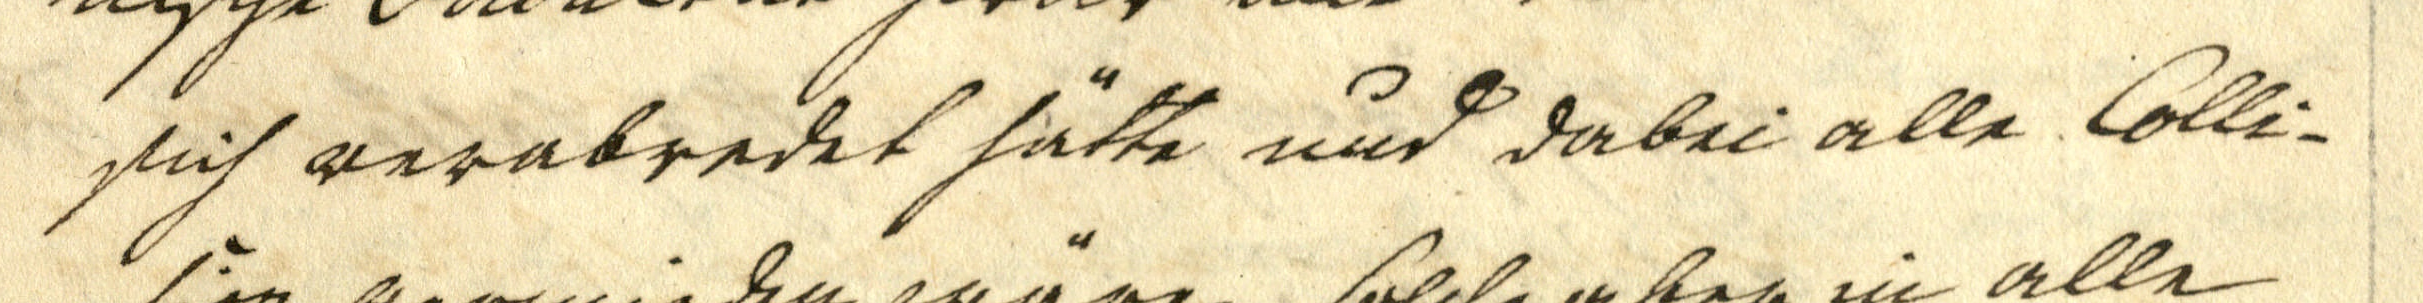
sich verabredet hätte und dabei alle Colli¬
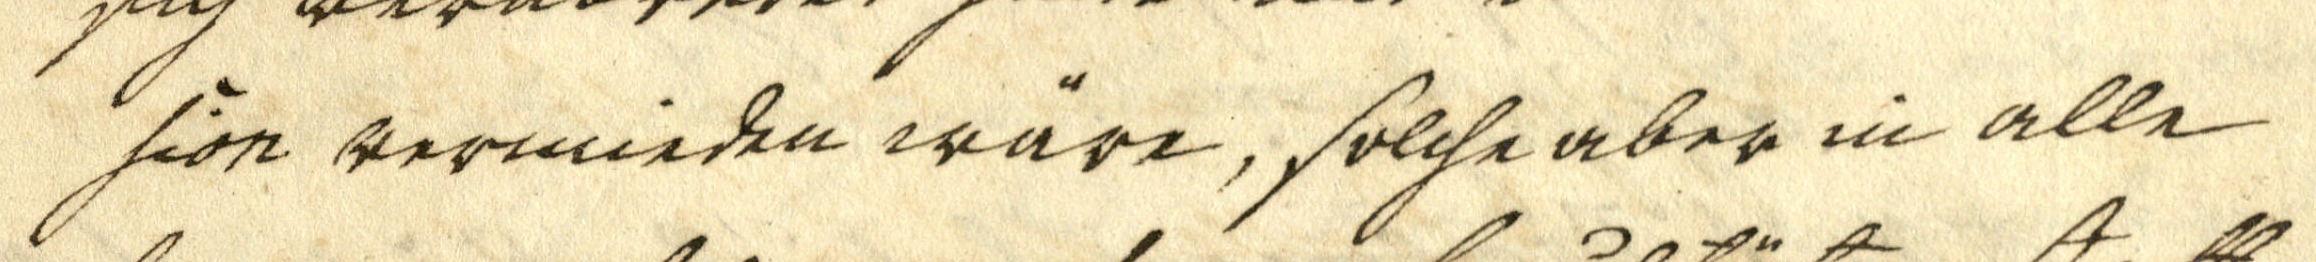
sion vermieden wäre, solche aber in alle
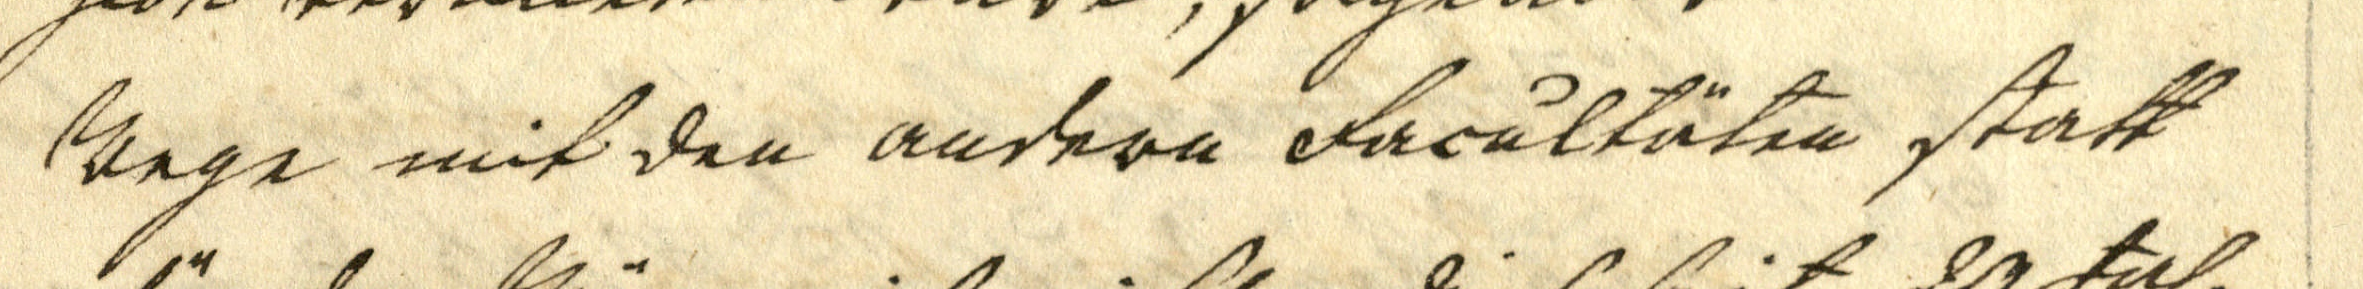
Wege mit den andern Facultäten statt
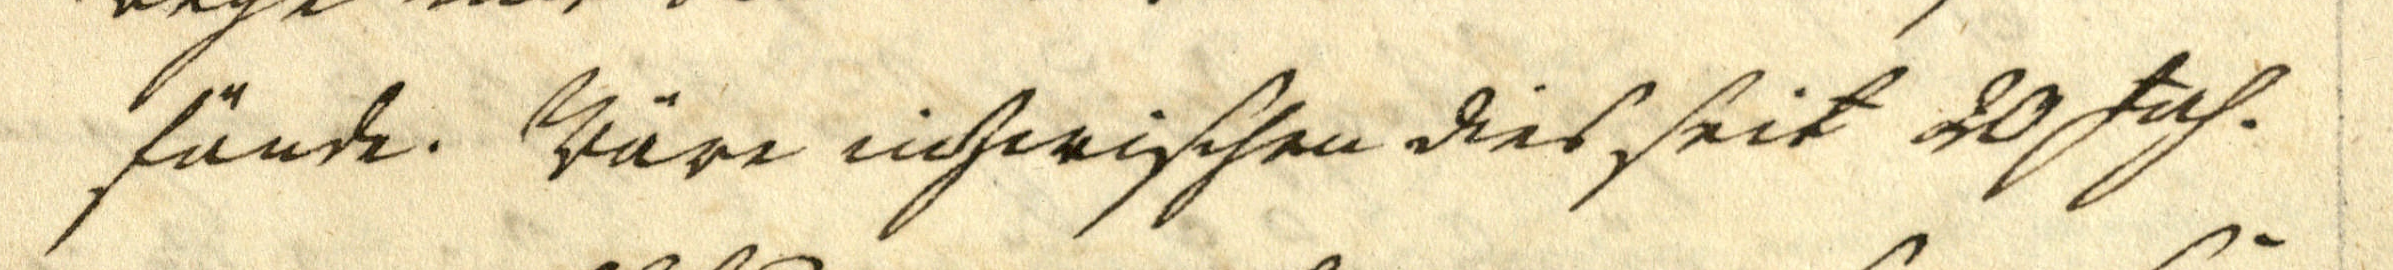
fände. Wäre inzwischen dies seit 20 Jah¬
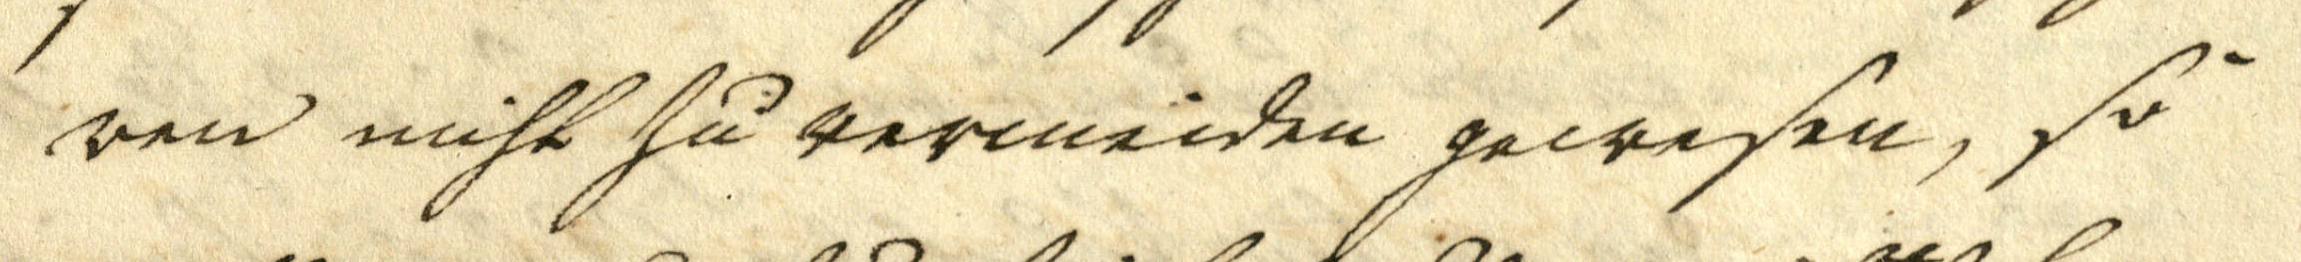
ren nicht zu vermeiden gewesen, so
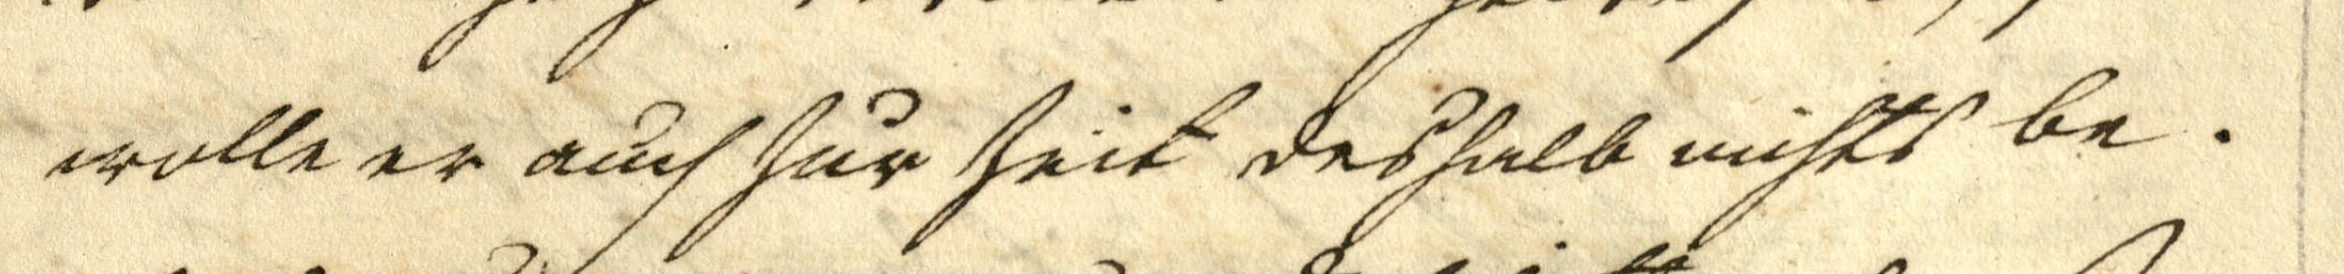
wolle er auch zur Zeit deshalb nichts be¬
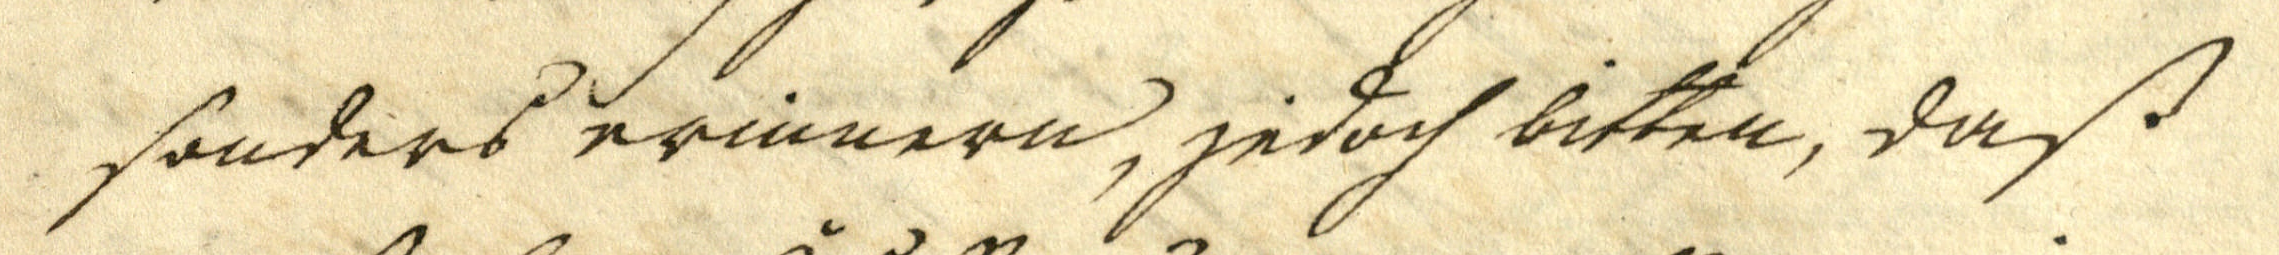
sonders erinnern, jedoch bitten, daß
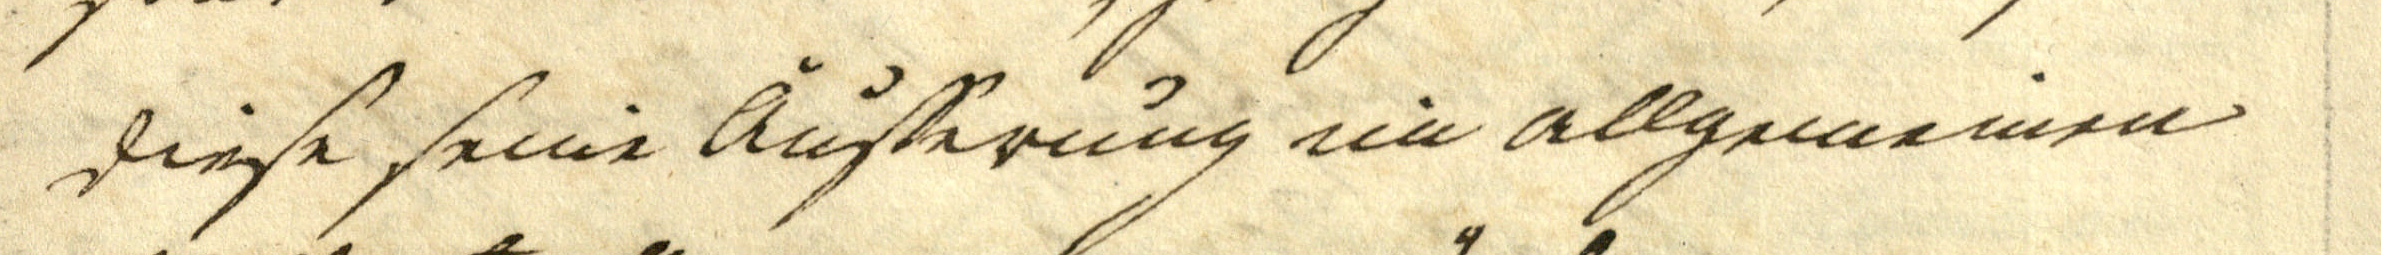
diese seine Äusserung im Allgemeinen
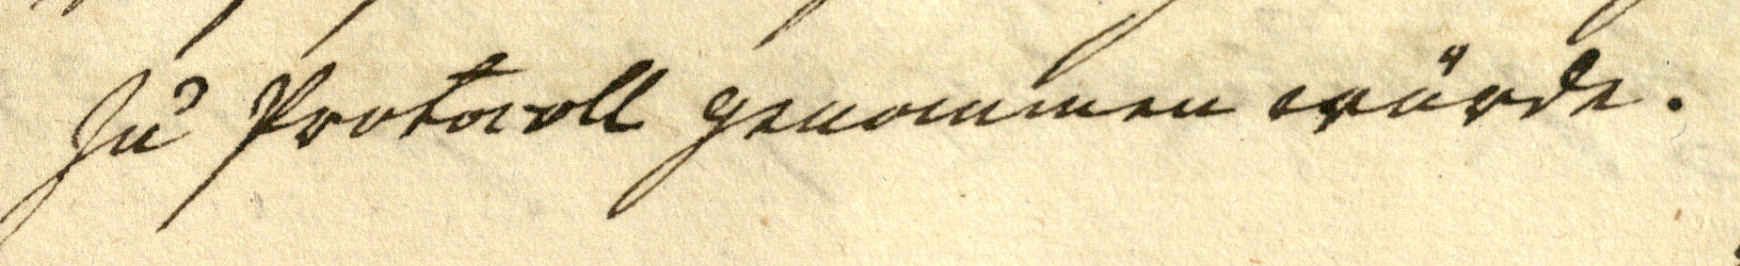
zu Protocoll genommen würde.
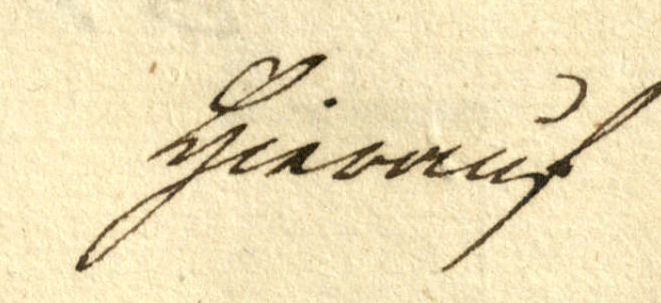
Hierauf
